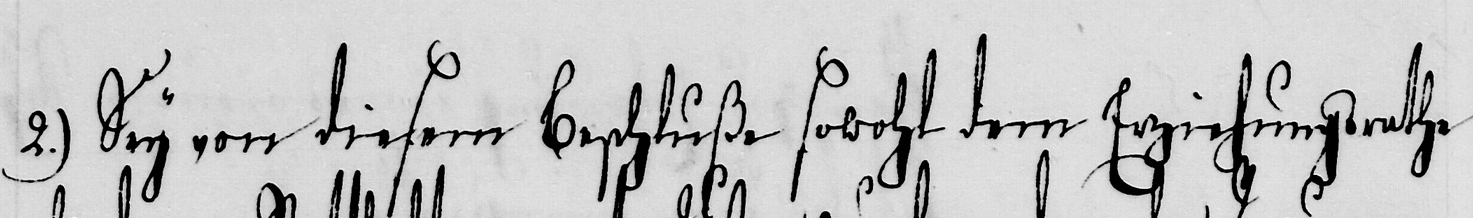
2.) Sey von diesem Beschluße sowohl dem Erziehungsrathe
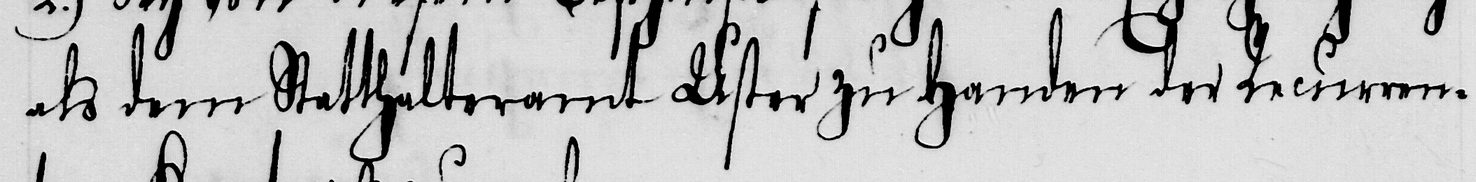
als dem Statthalteramt Uster zu Handen der Recurren¬
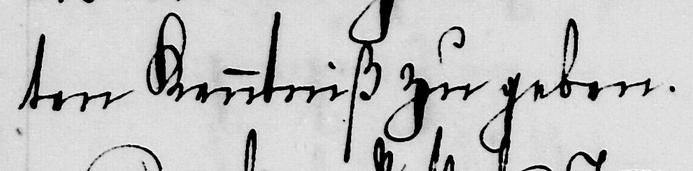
ten Kenntniß zu geben.
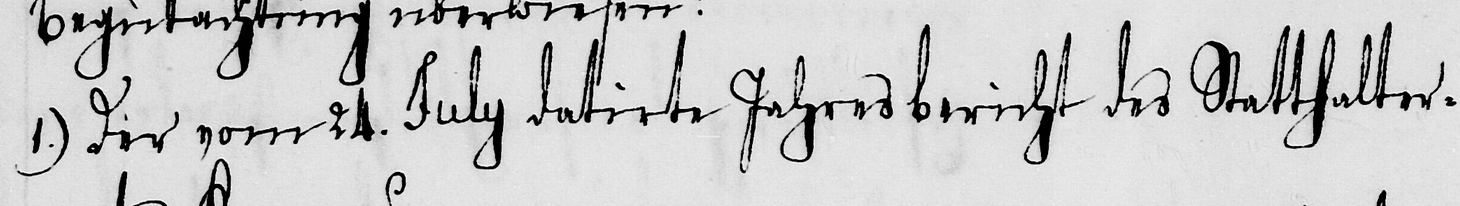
1.) Der vom 24. July datirte Jahresbericht des Statthalter¬
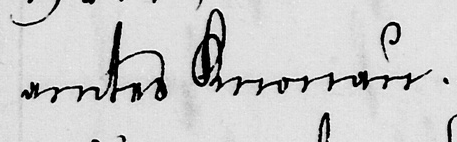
amtes Knonau.
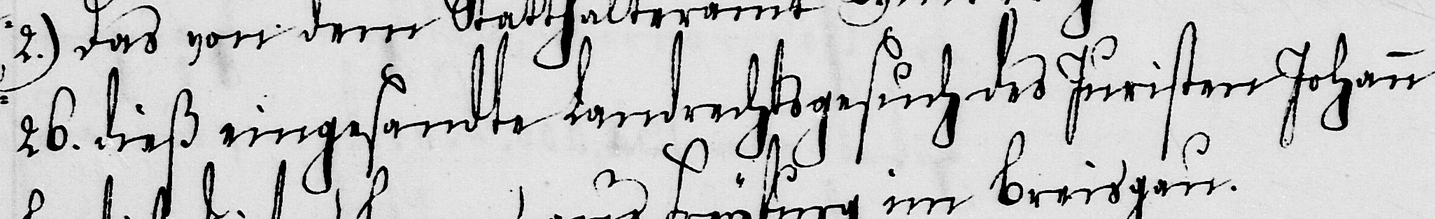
26. dieß eingesandte Landrechtsgesuch des Juristen Johann
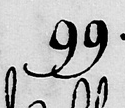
2.)
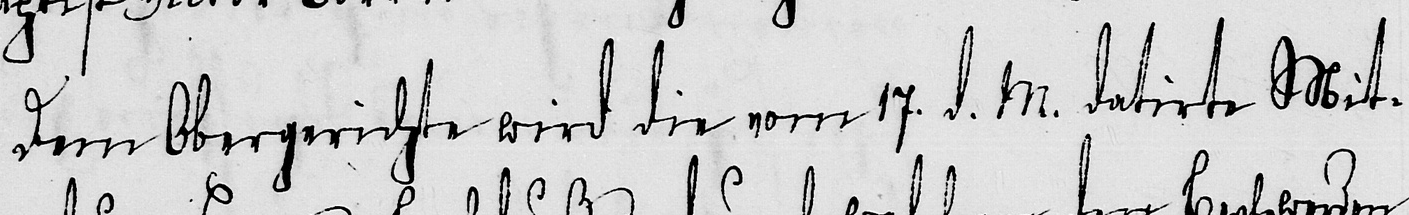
Dem Obergerichte wird die vom 17. d. M. datirte Mit¬
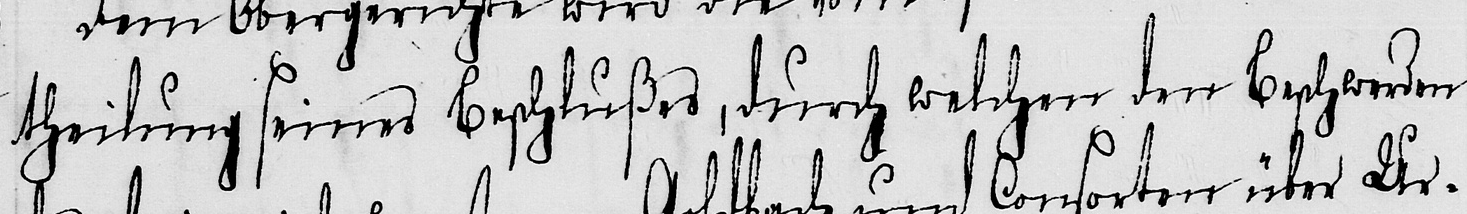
theilung seines Beschlußes, durch welchen den Beschwerden
